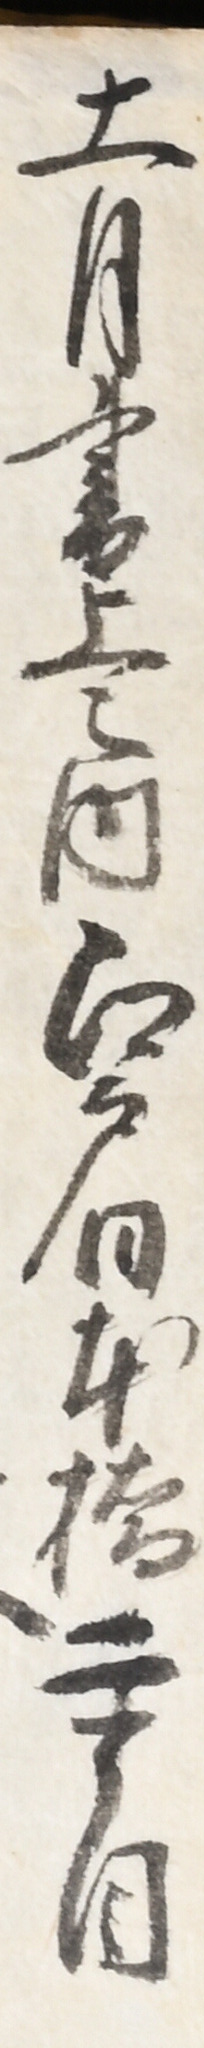十一月書上之内江戸日本橋二丁目
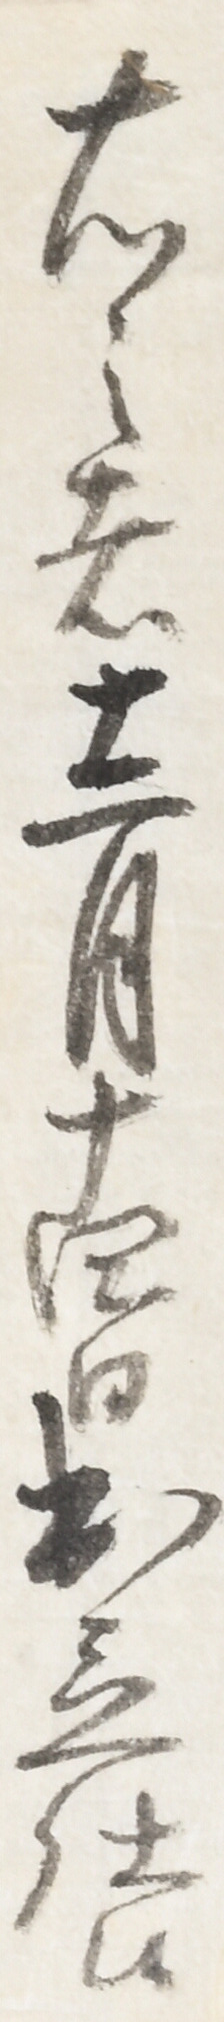右之者十二月十四日出立仕候
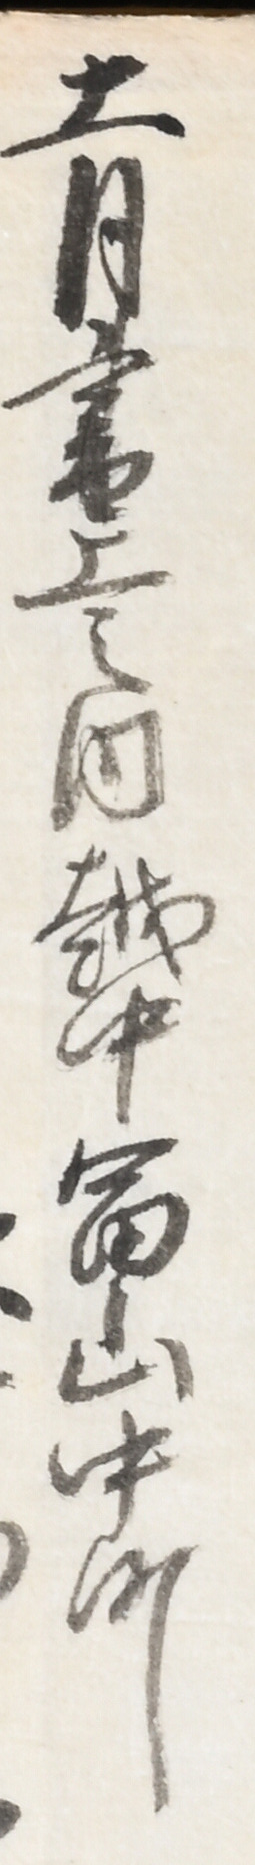十一月書上之内越中富山中町
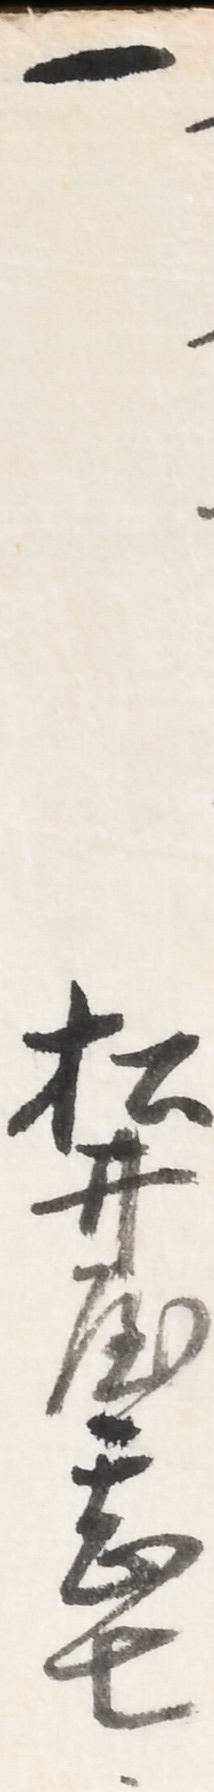一松井屋甚七・
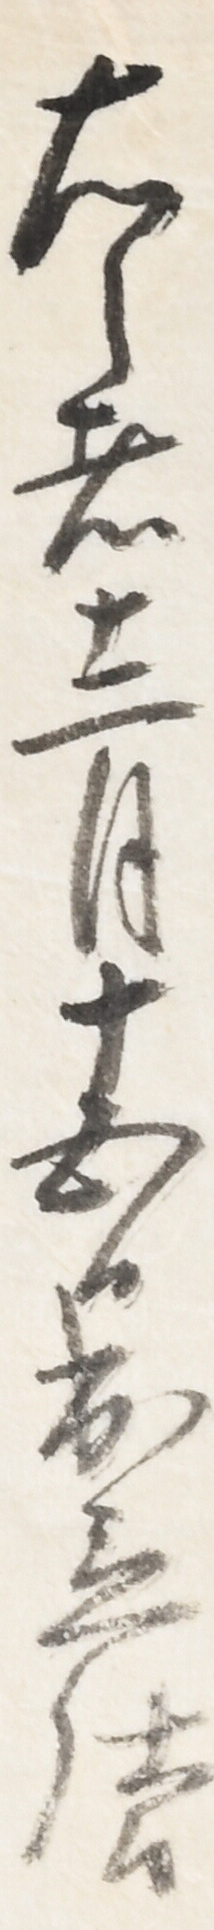右之者十二月十五日出立仕候
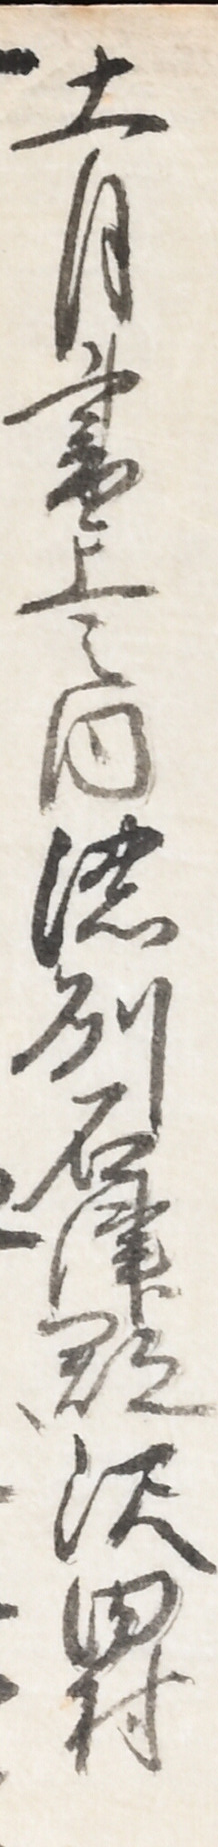十一月書上之内濃州石津郡沢田村
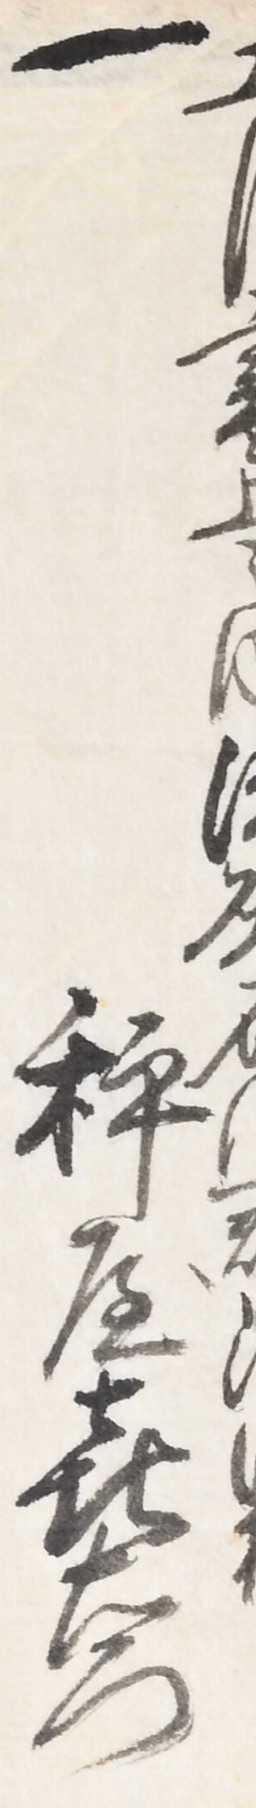一秤屋喜右衛門・
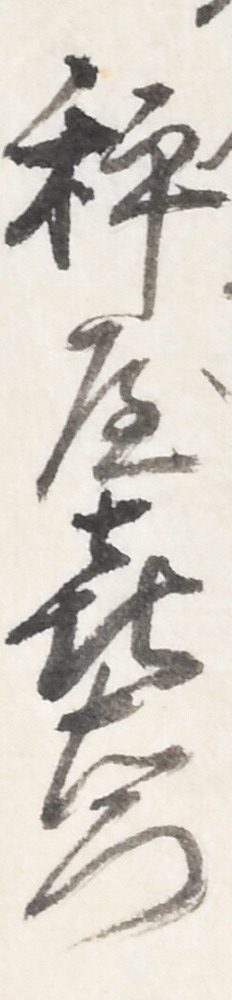一秤屋喜右衛門・
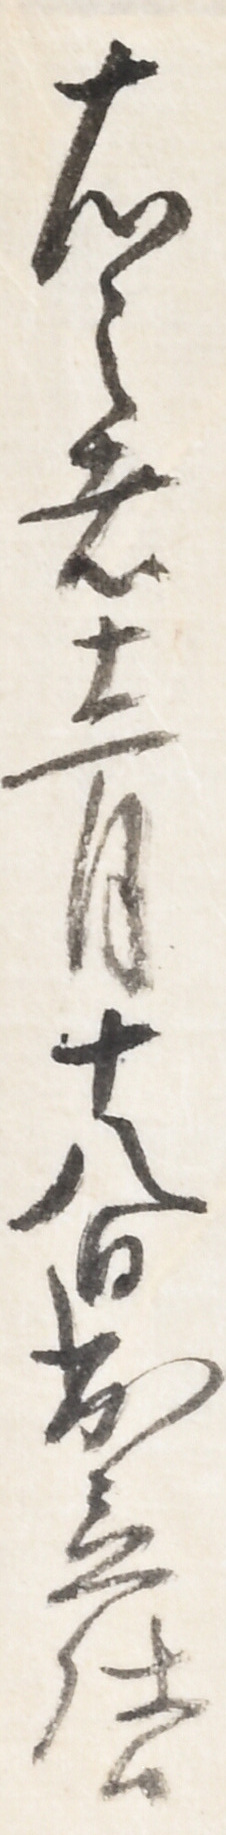右之者十二月十八日出立仕候
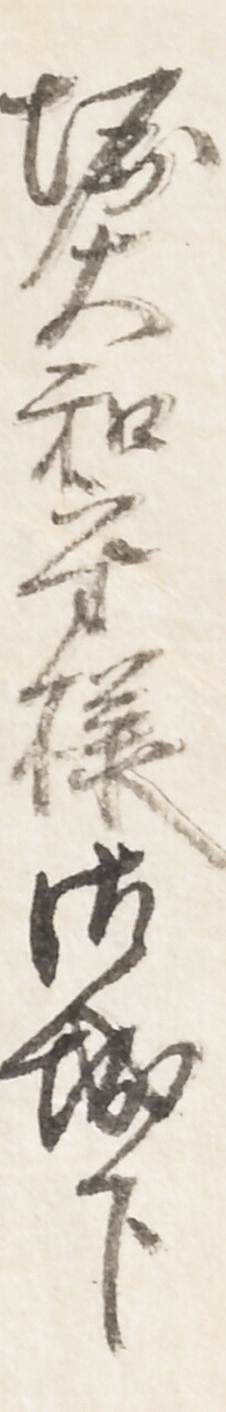堀大和守様御城下
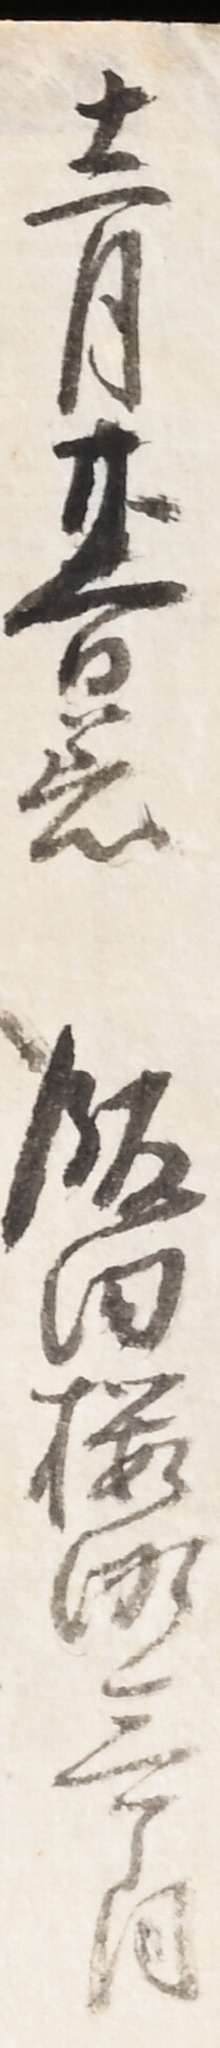十二月廿一日着飯田桜町三丁目
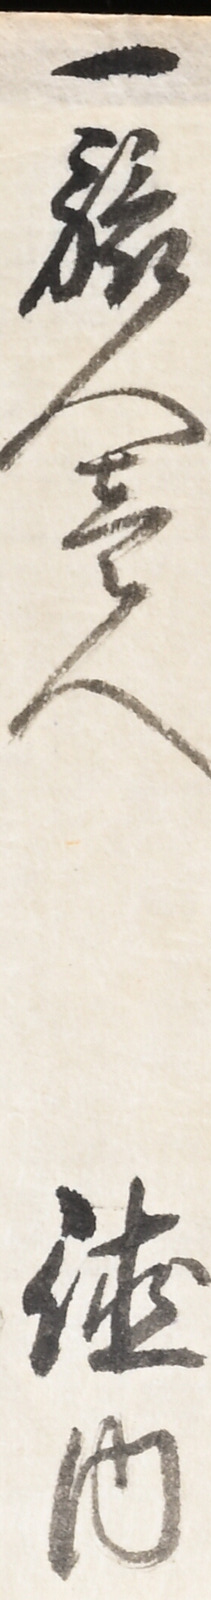一旅人壱人徳内
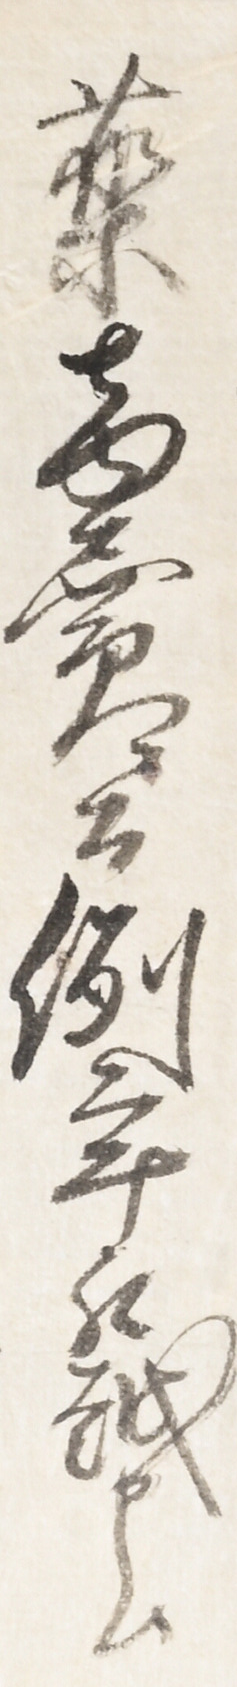薬商売ニ而例年罷越申候
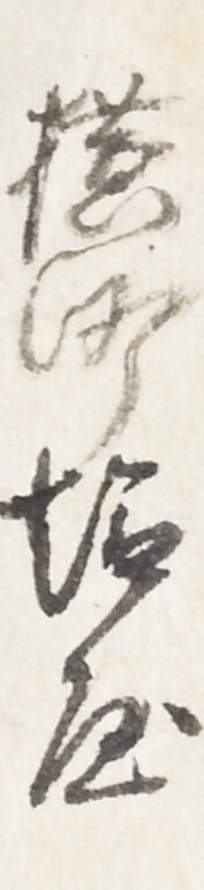横町塩屋
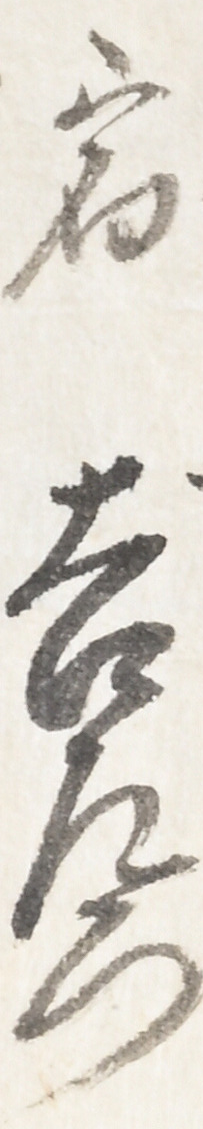宿吉左衛門
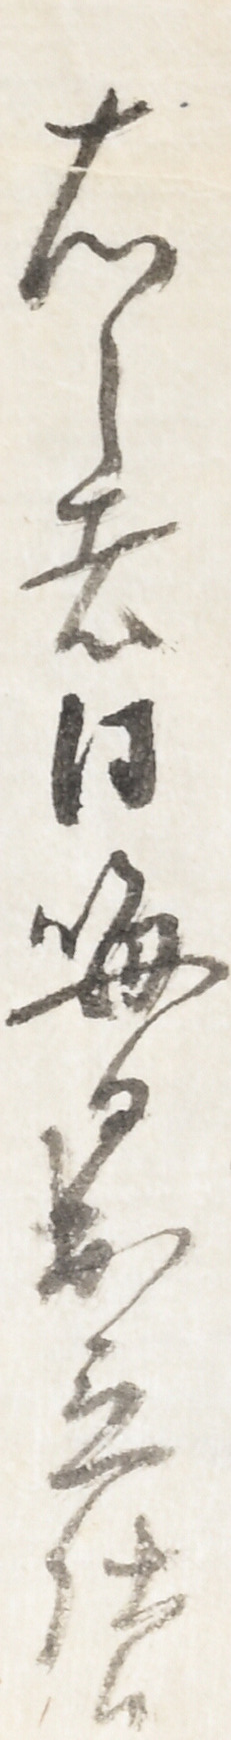右之者同晦日出立仕候
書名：旅人泊控帳
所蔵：伊那市立高遠町図書館・合同会社AMANE
